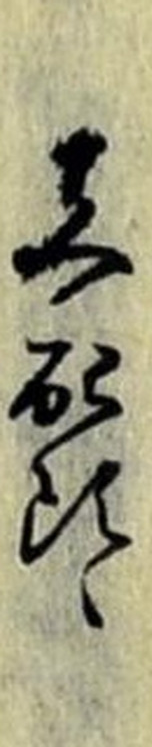支配頭へ
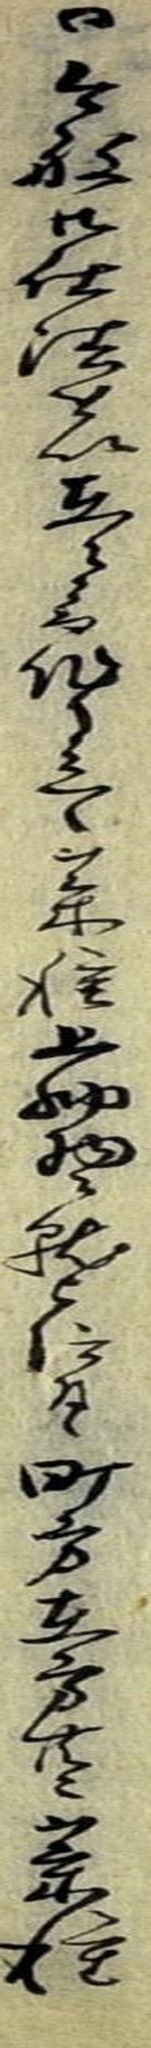〇今般御仕法を以在々ニ而作り立候薬種上納物ニ就被仰付候町方在方共ニ薬種
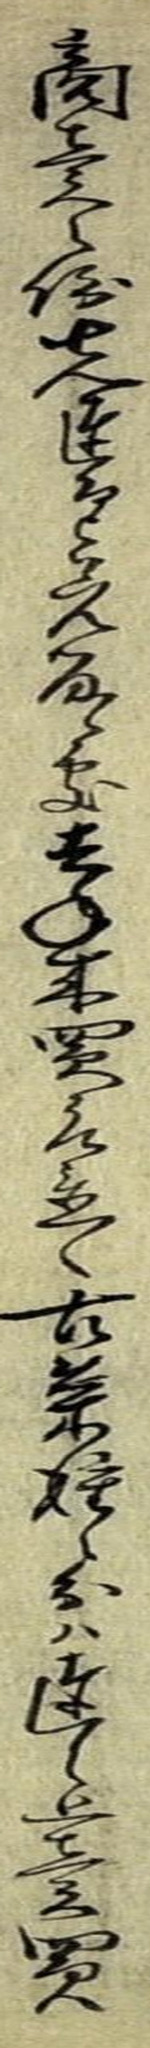商売之儀先達而被差留候処去年来買取置候古薬種之分ハ達之上売買
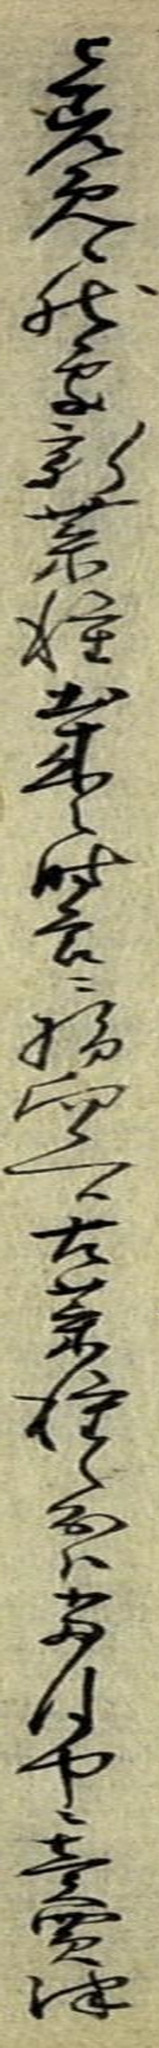被差免候然処新薬種出来候時節ニ指向候ヘハ古薬種之分ハ当月中ニ売買津
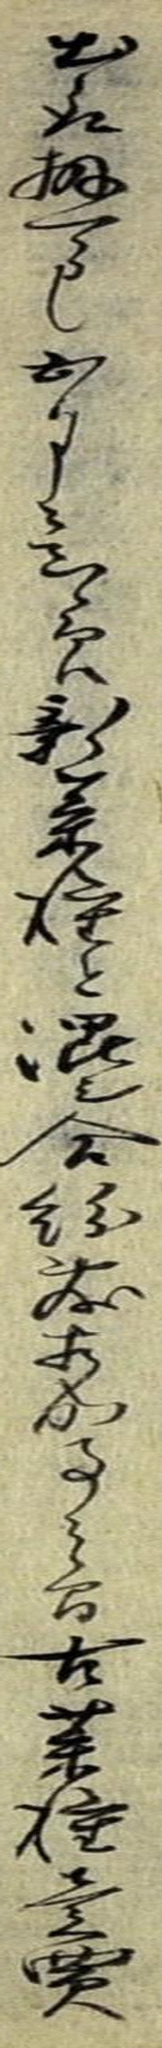出取扱可申候五月ニ至候而ハ新薬種と混シ合紛敷相成事ニ候間古薬種売買
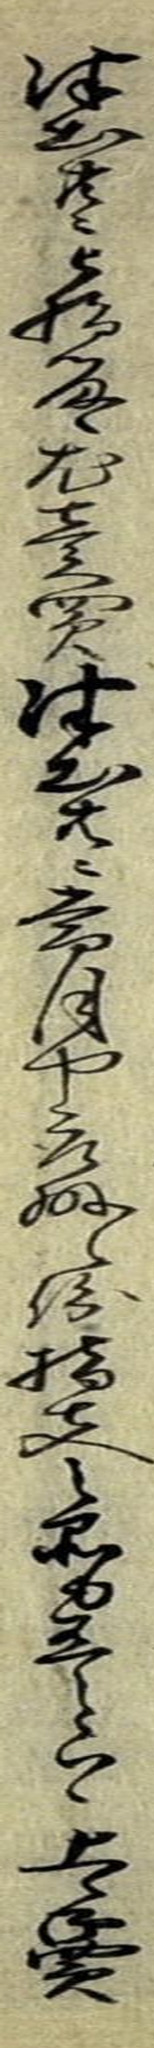津出共ニ被指留候尤売買津出共ニ当月中取扱候儀指支之品も有之候ハヽ上へ御買
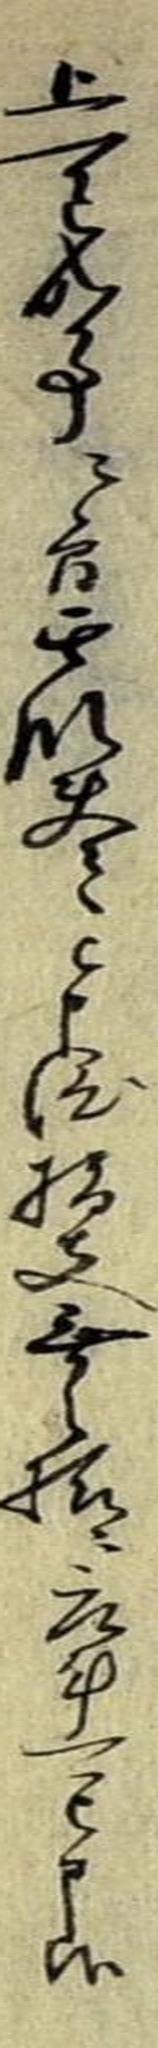上可被成事ニ候間其段夫々へ被申渡指支無之様ニ取計可被申候
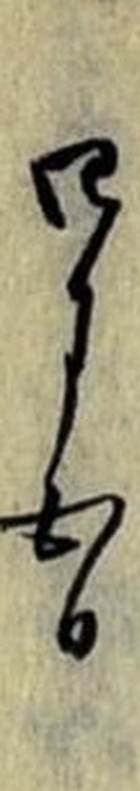四月五日
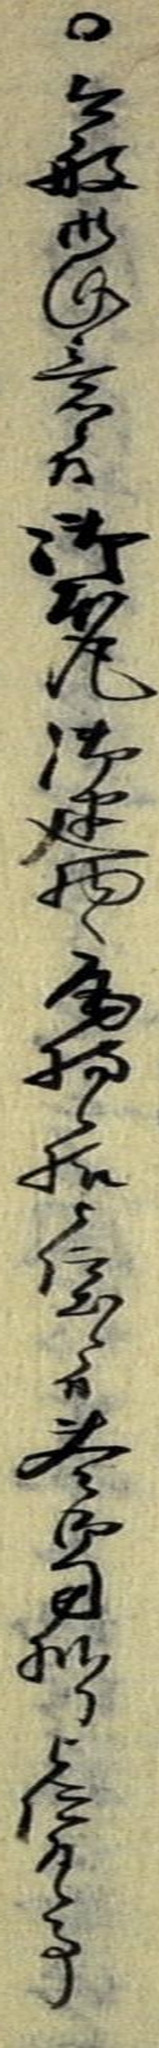〇今般御趣意ニ付御本丸御建物へ瓦候様被仰出候ニ付夫々御用掛り被仰付候事
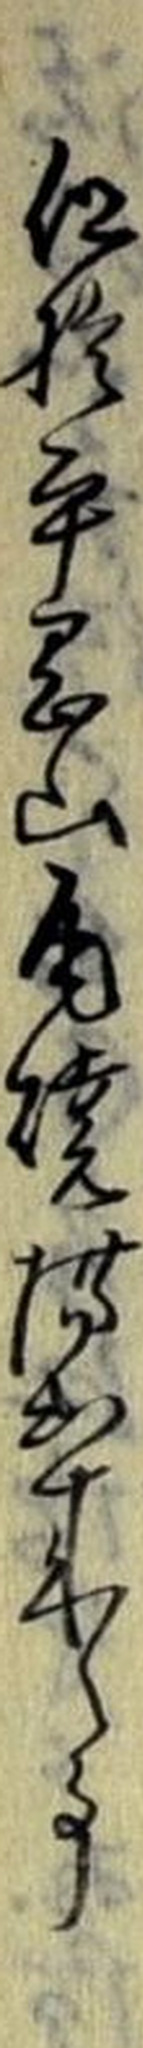但於平岡山瓦焼場出来候事
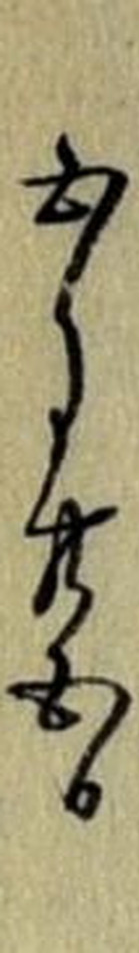五月廿五日
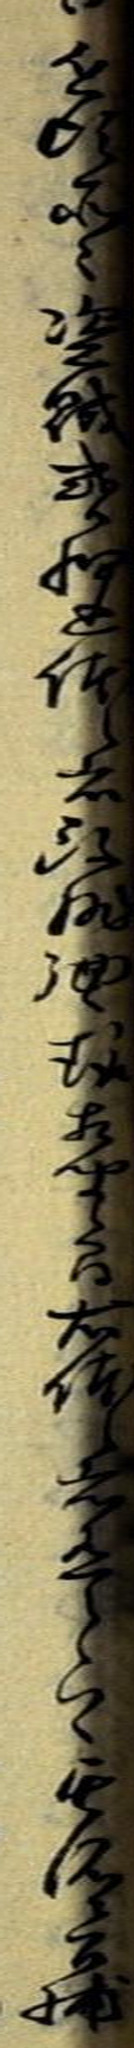〇近頃所々盗賊或ハ押込体之者致徘徊趣相聞候間右体之者有之候ハヽ其所ニ召捕
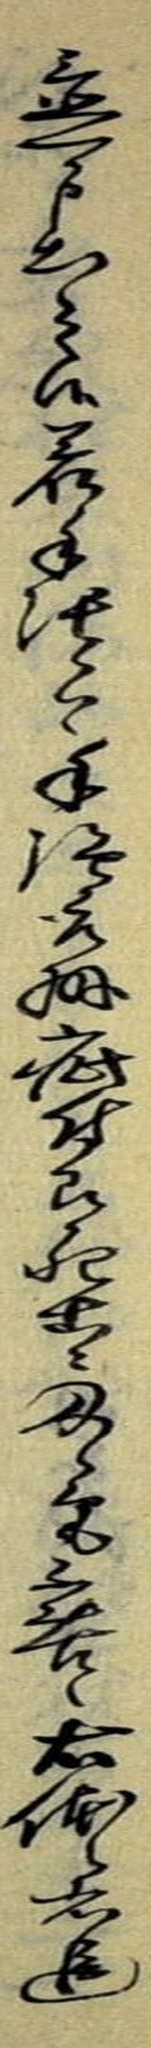置可申出之候若手張候ハヽ手強取扱疵付即死等ニ及候而も不苦候右体之者追
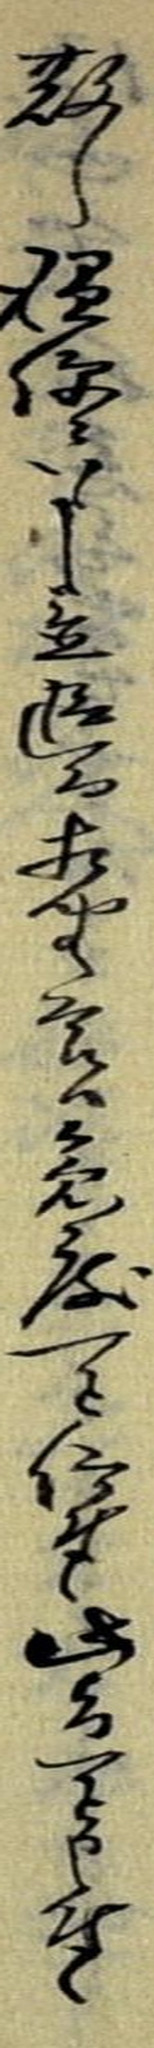散し穏便ニいたし置追而相聞候節ハ急度可被仰付候此旨可被申付候
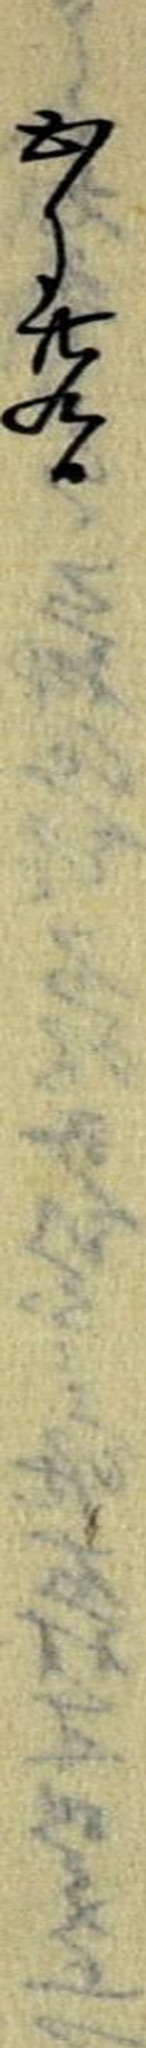五月廿九日
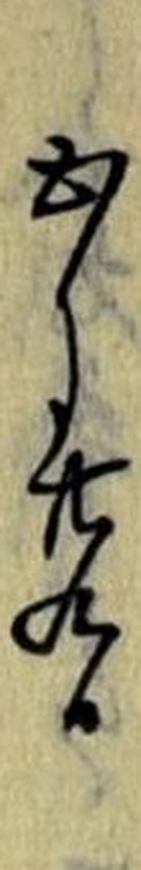五月廿九日
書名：命令之部 三
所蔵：福井県文書館 Fukui Prefectural Archives
